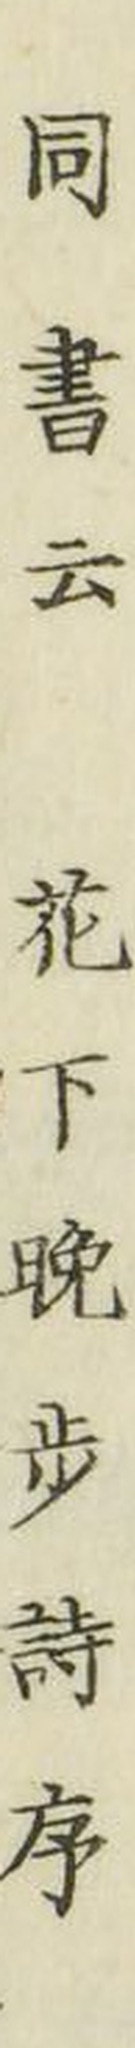同書云花下晩歩詩序
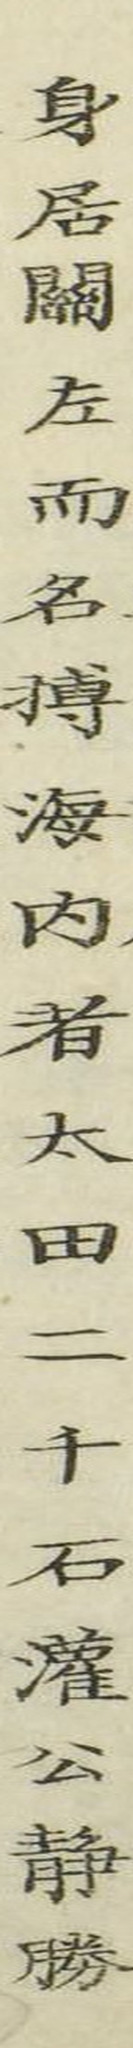身居關左而名搏海内者太田二千石灌公静勝
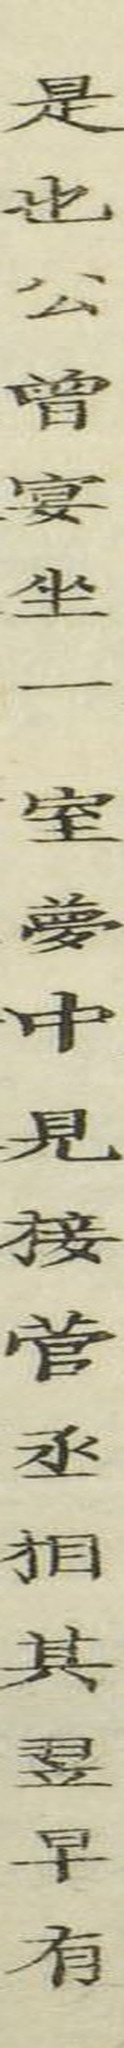是也公曽宴坐一室夢中見椄菅丞相其翌早有
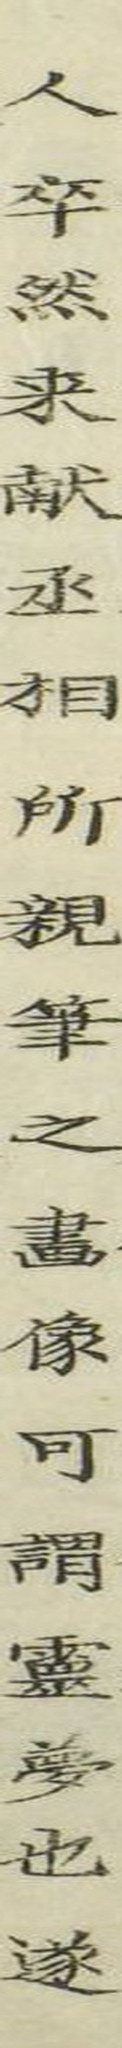人卒然来献丞相所親筆之畵像可謂靈夢也遂
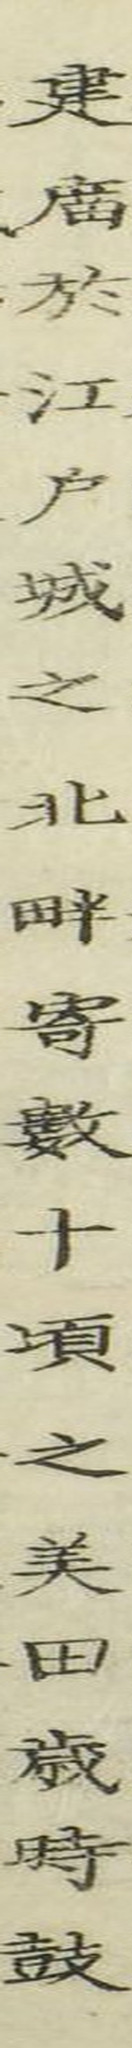建庿於江戸城之北畔寄數十項之美田歳時鼓
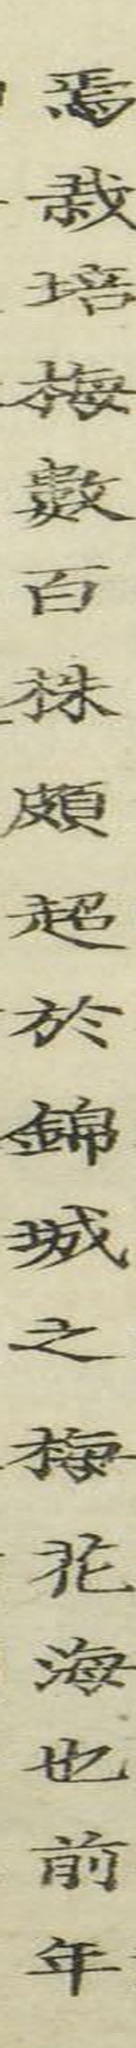焉栽培梅數百株頗超於錦城之梅花海也前年
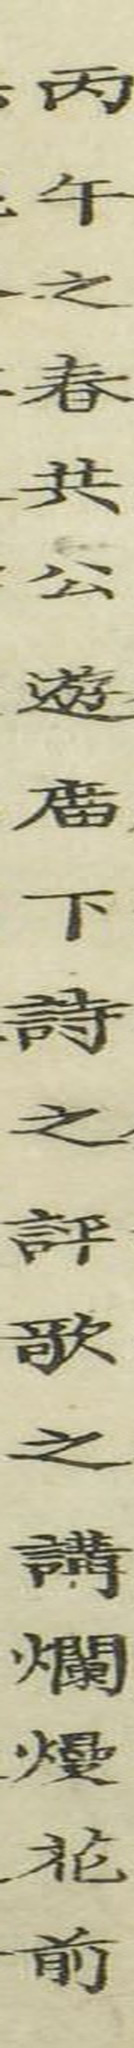丙午之春共公遊庿下詩之評歌之講爛漫花前
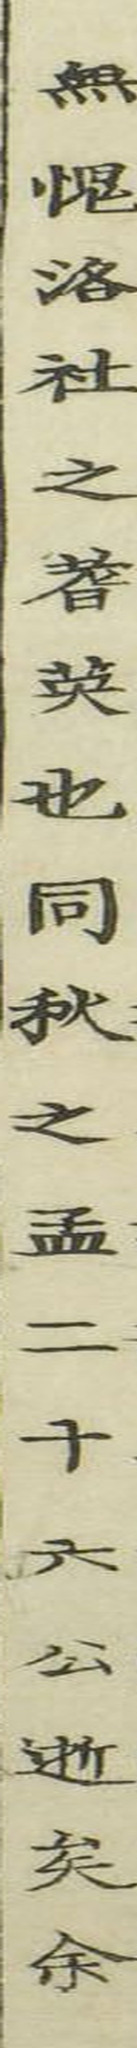無愧洛社之耆英也同秋之孟二十六公逝矣余

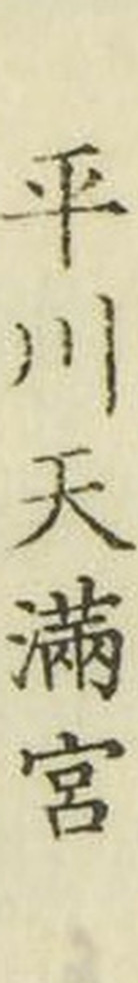平川天滿宮

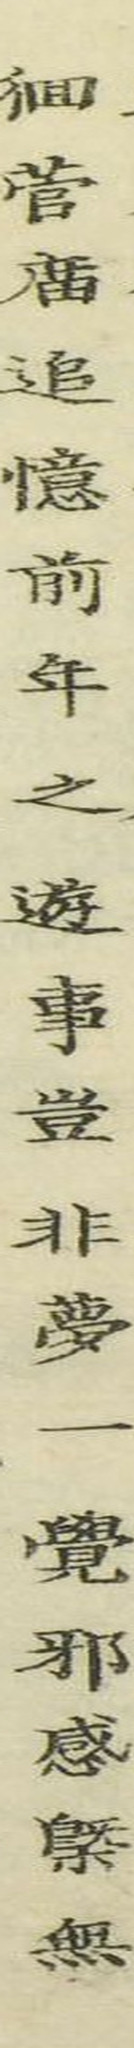徊菅庿追憶前年之遊事豈非夢一覺邪感檗無
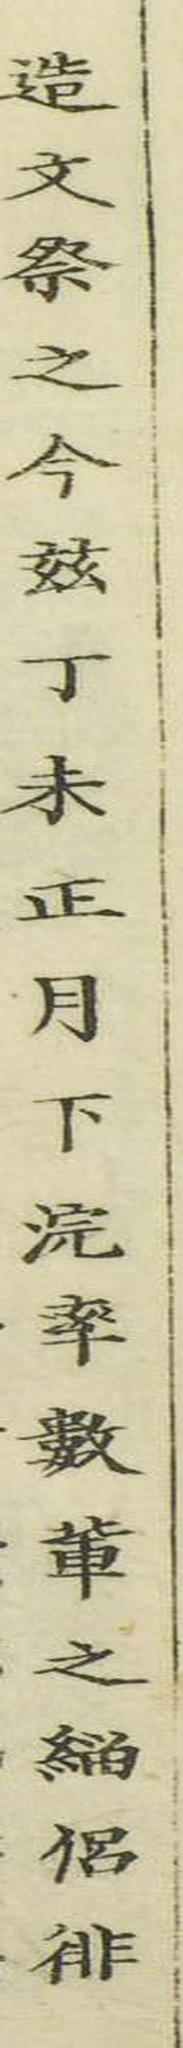造文祭之今茲丁未正月下浣率數輩之緇侶徘
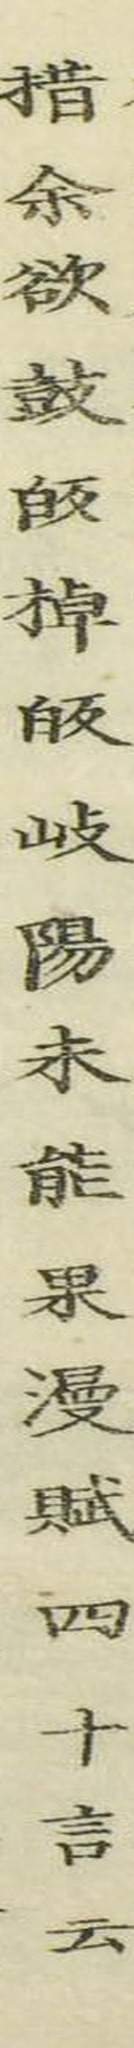措余欲鼓皈棹皈岐陽未能果漫賦四十言云
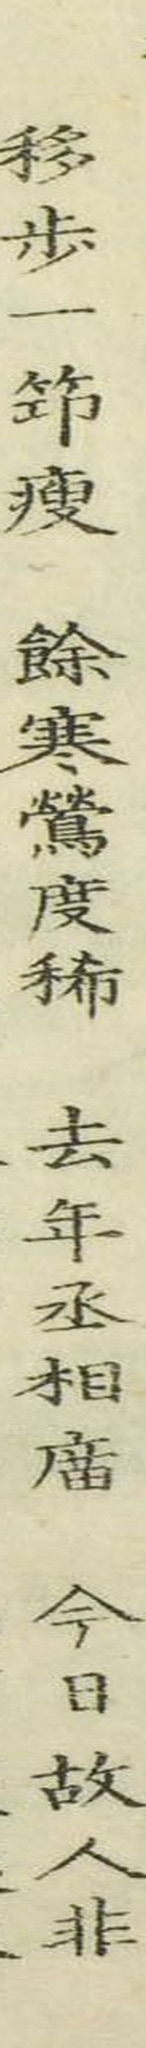移歩一笻痩餘寒鶯度稀去年丞相庿今日故人非
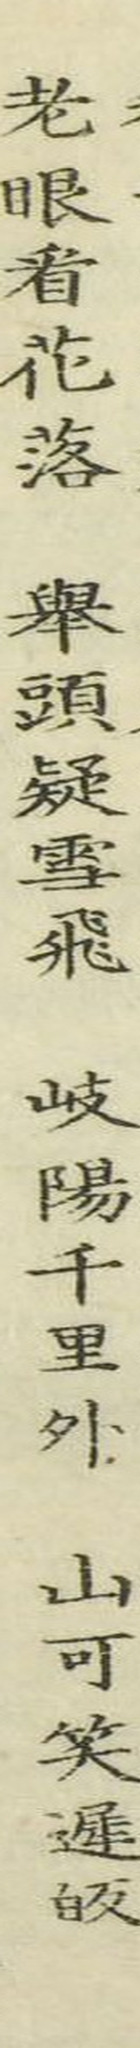老眼看花落擧頭疑雪飛岐陽千里外山可笑遲皈
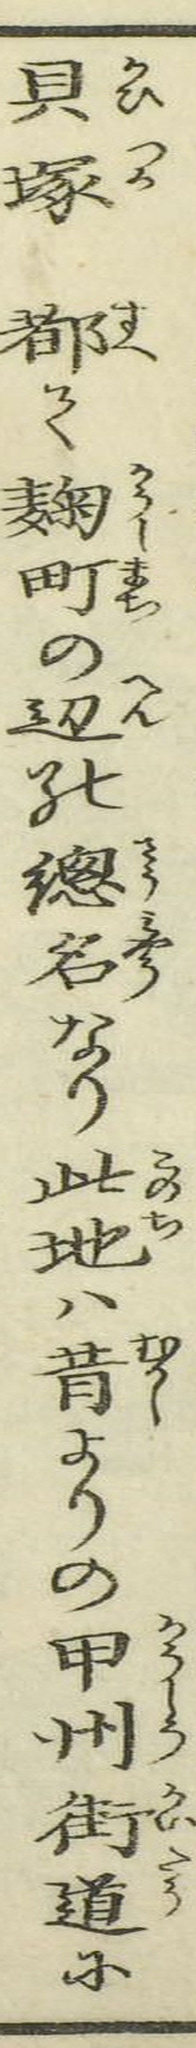貝塚都て麹町の辺の總名なり此地は昔よりの甲州街道に
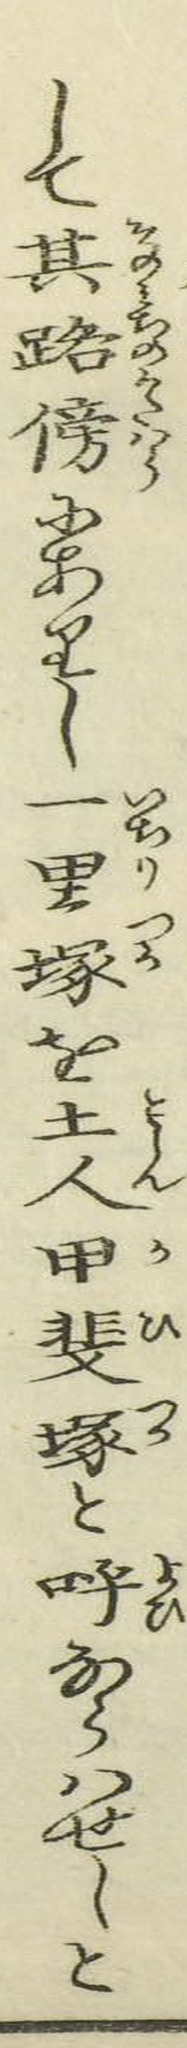して其路傍にありし一里塚を土人甲斐塚と呼ならはせしと
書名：江戸名所図会 20巻 巻之7
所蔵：東京学芸大学教育コンテンツアーカイブ
